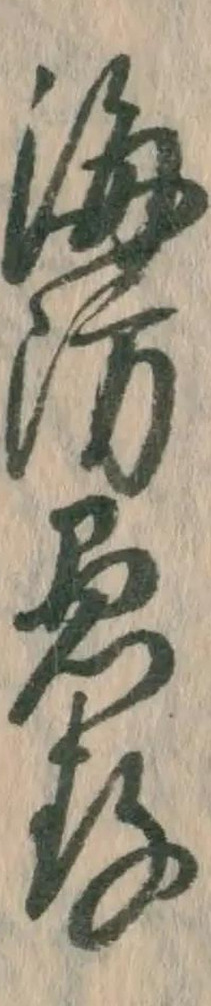海防愚存
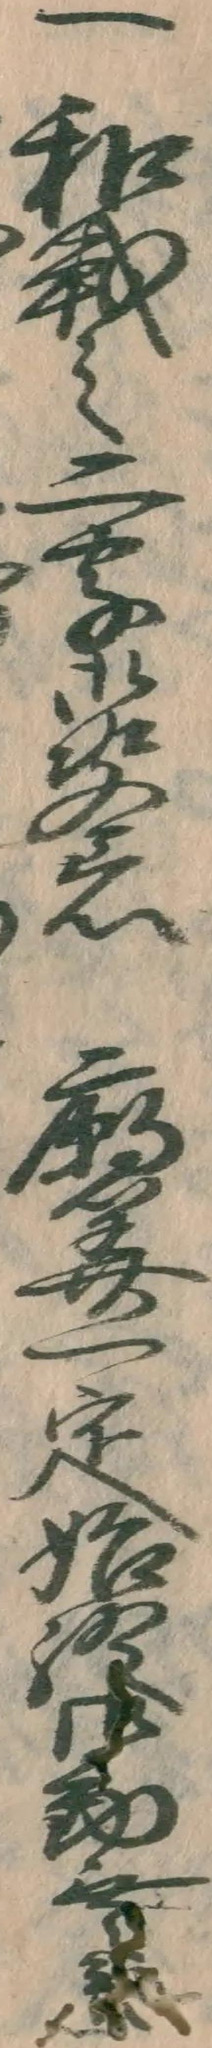一和戦之二文字御決意廟算一定始終御動無之義
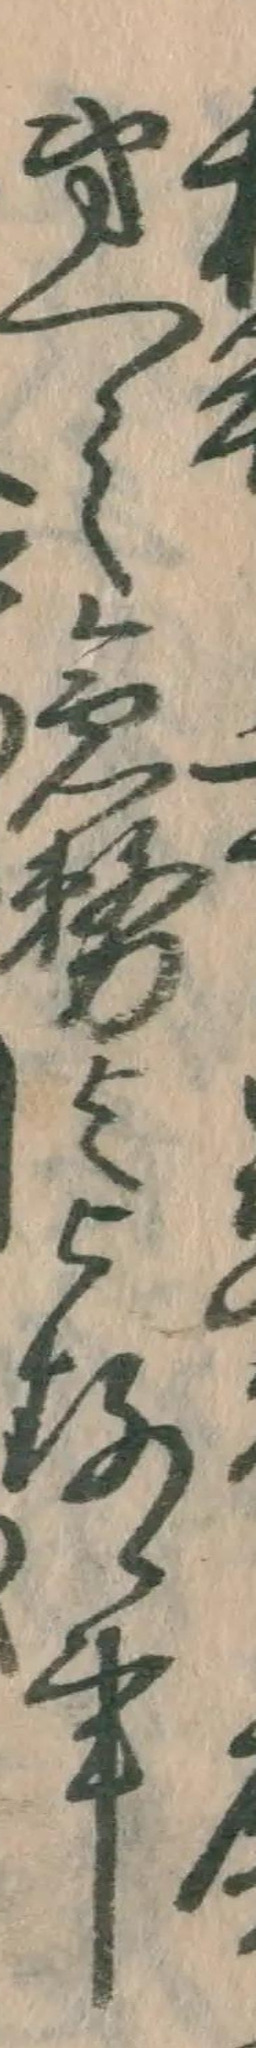第一之急務与被存候事
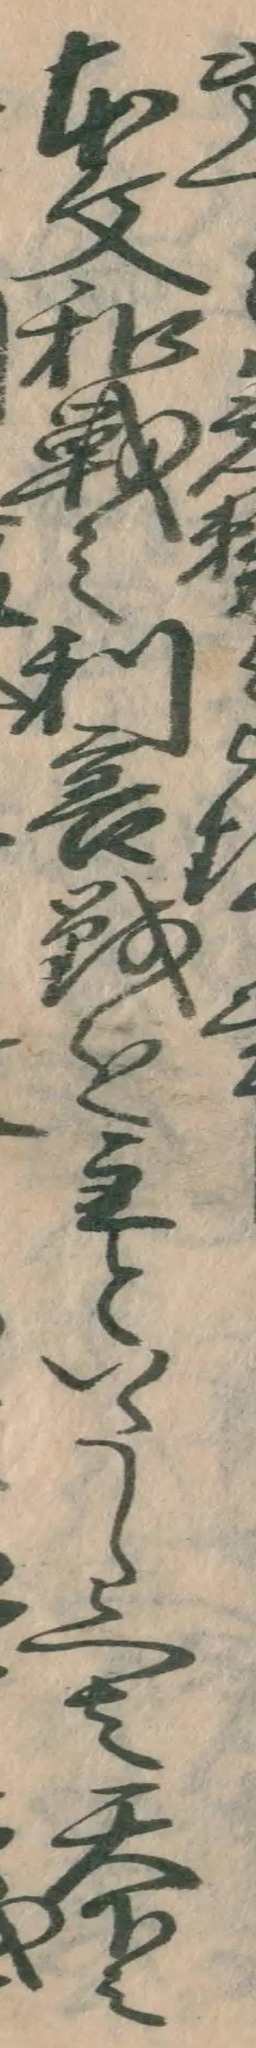一本文和戦之利害戦を主といたし候へ者天下之
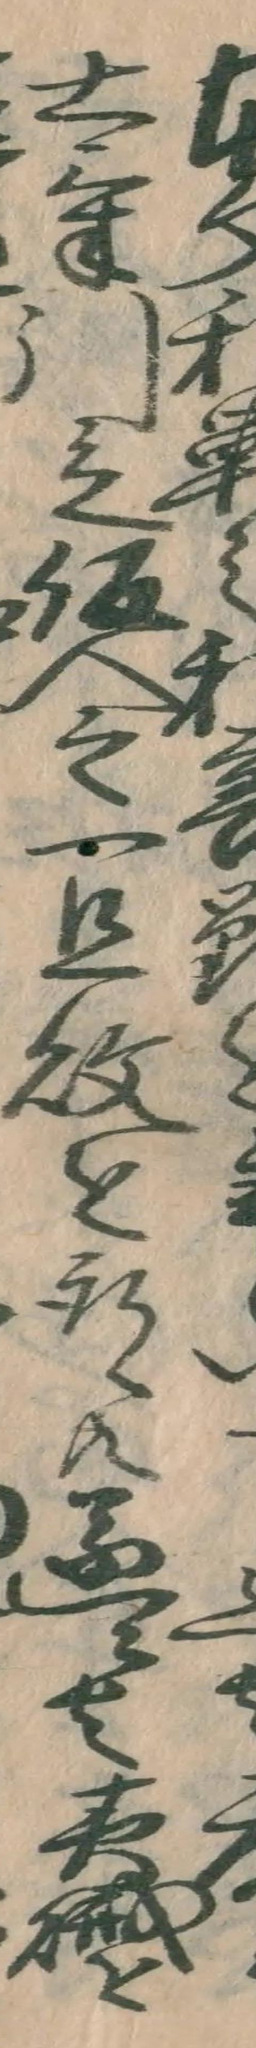士気引立仮令一旦敗を取候共遂ニ者夷賊を
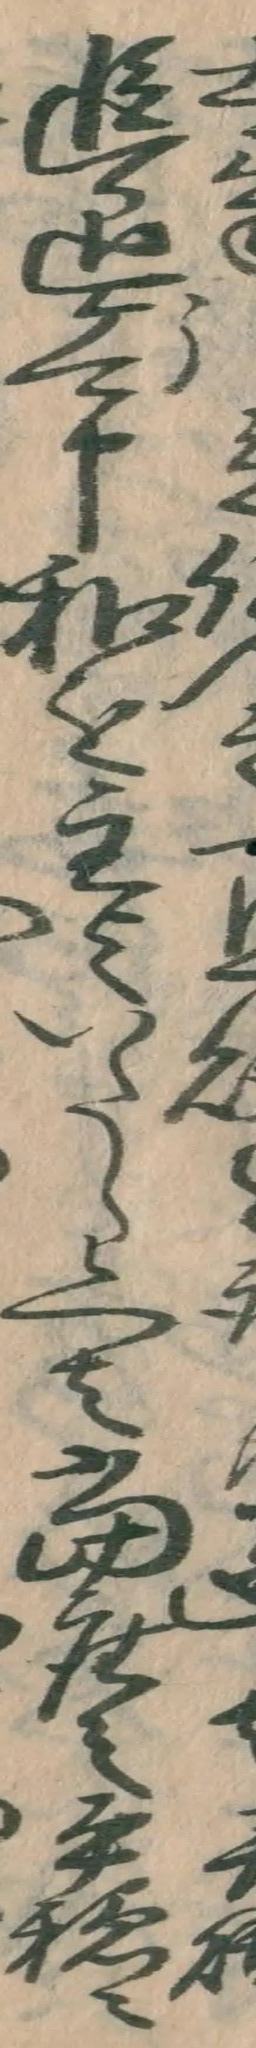追退ケ可申和を主与いたし候へ者當座之平穏ニ
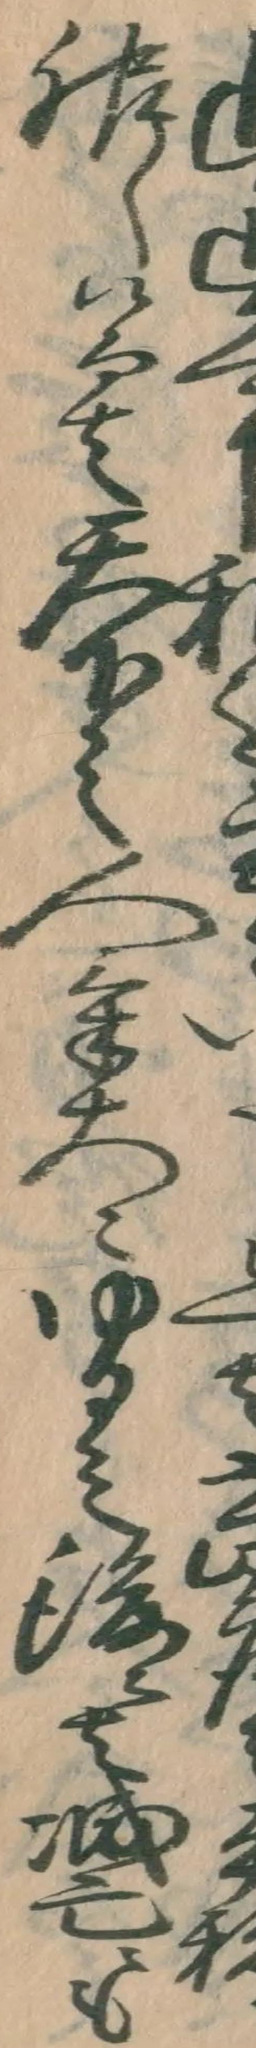服し候而者天下之人氣大ニゆるミ後ニ者滅亡ニも

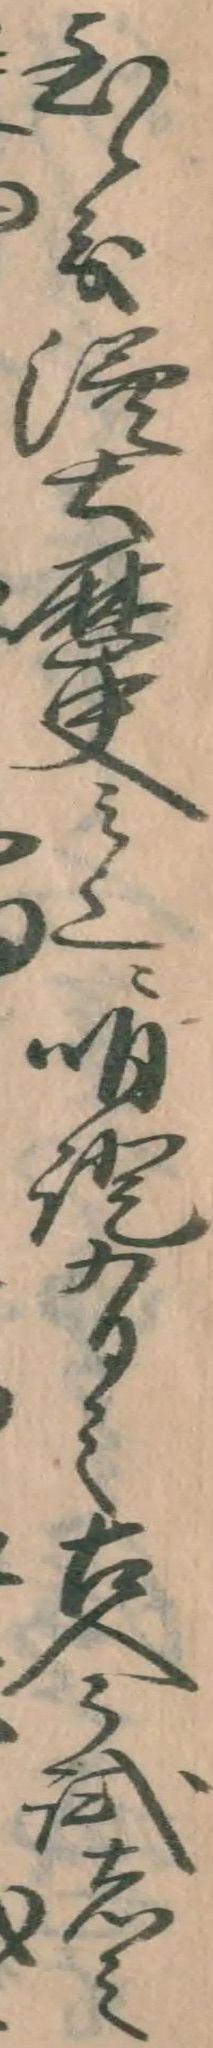至候義漢土歴史之上ニ明證有之古今識者之
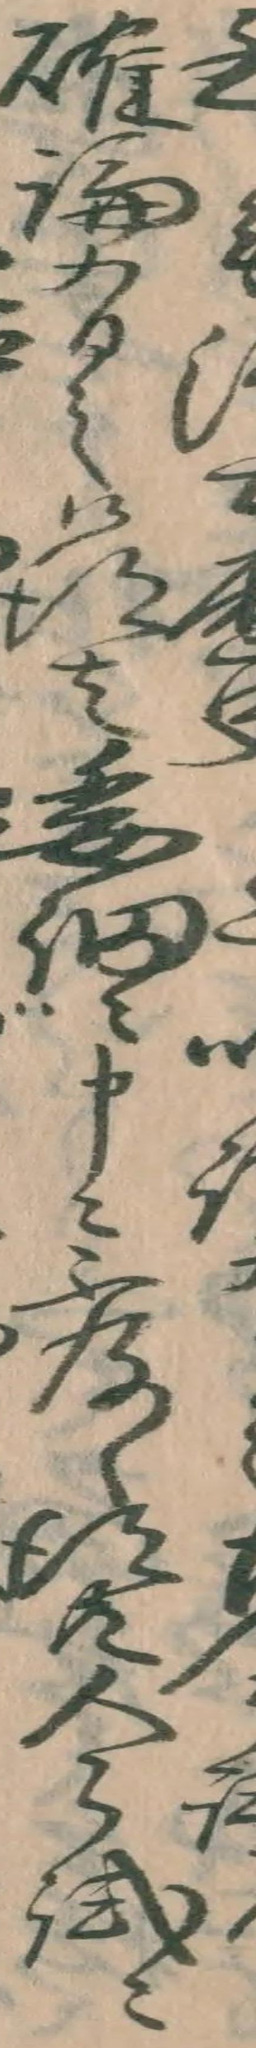確論有之候得者委細ニ申ニ不及候得共今試ニ
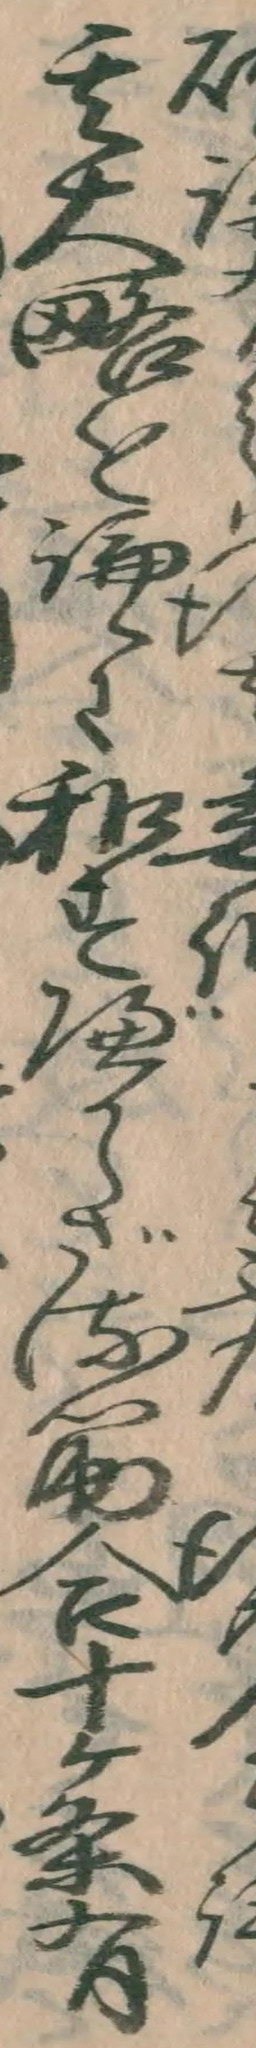其大略を論候に和すべからざる筋合十ケ条有
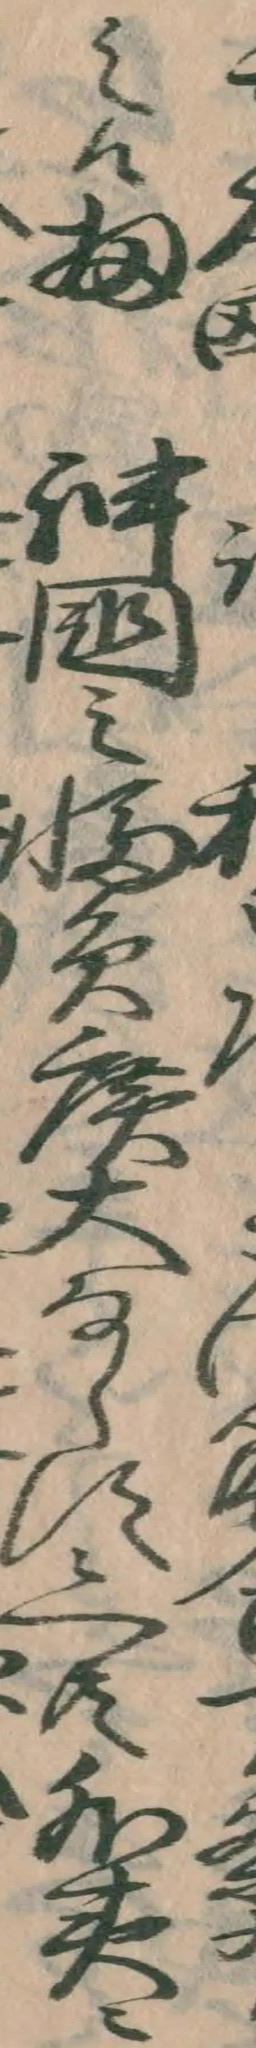之候扠神国之幅員廣大ならす候へ共外夷ニ
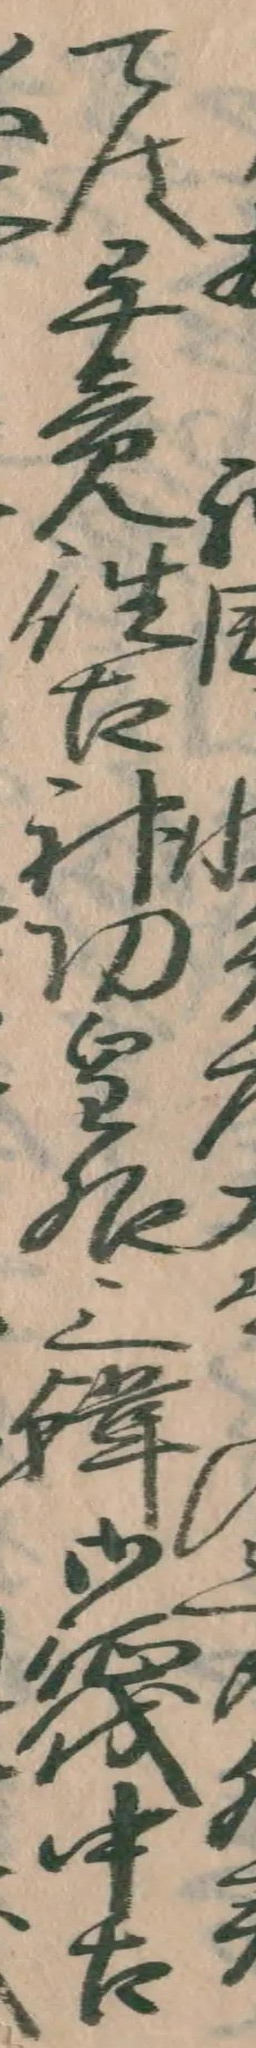ては畢竟往古神功皇后三韓御征伐中古
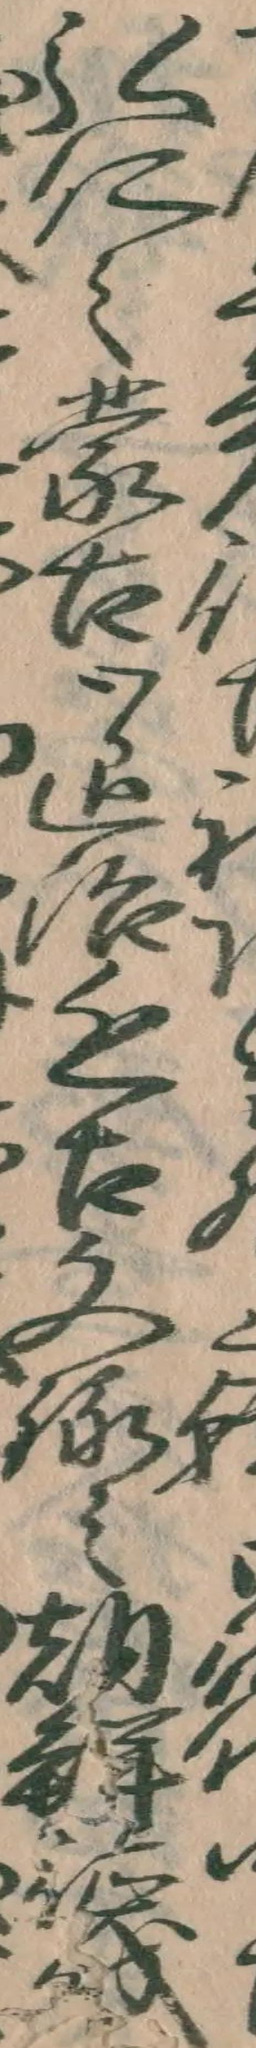弘仁之蒙古御退治近古文禄之朝鮮征伐
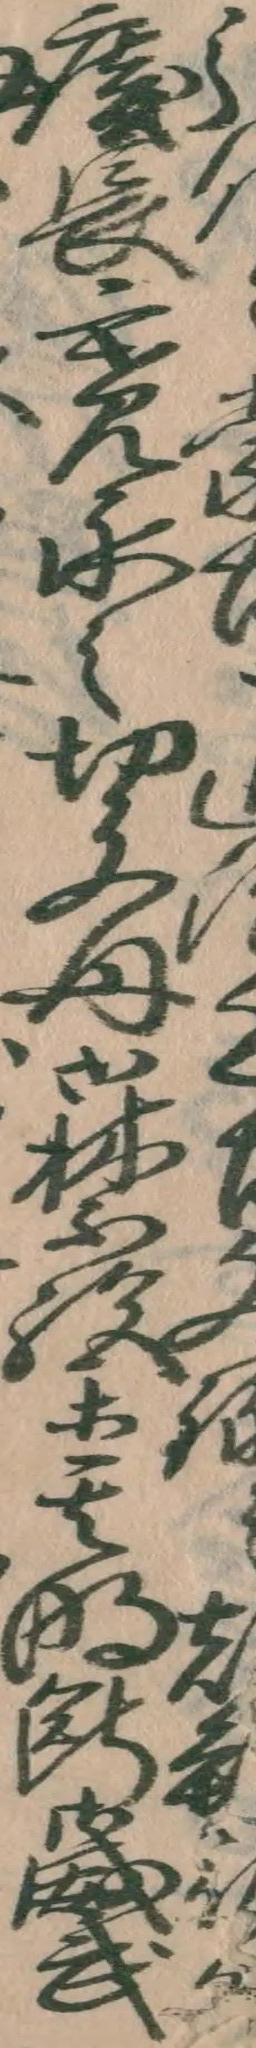慶長寛永之切支丹御禁絶等其明断御威武
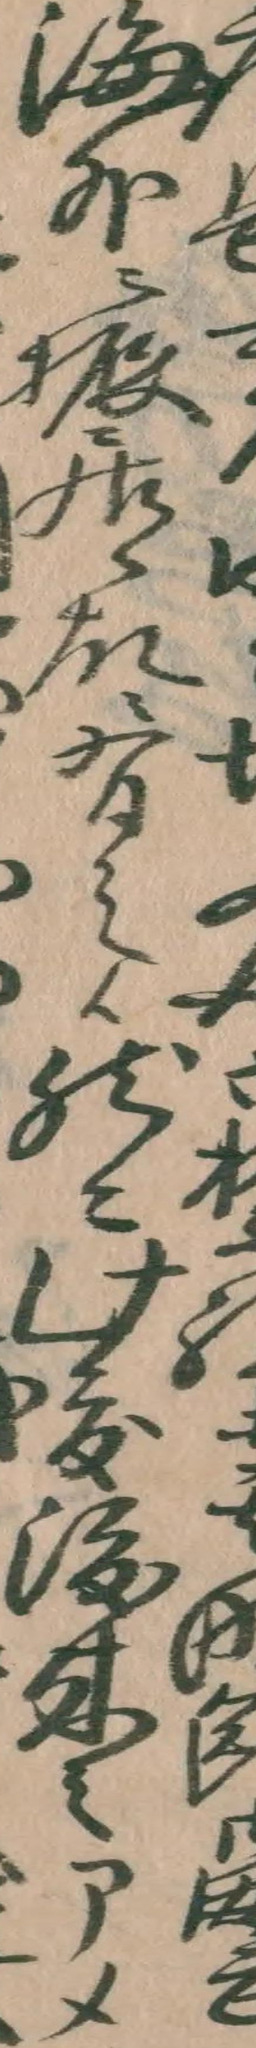海外ニ振居候故ニ有之候然ニ此度渡来之アメ
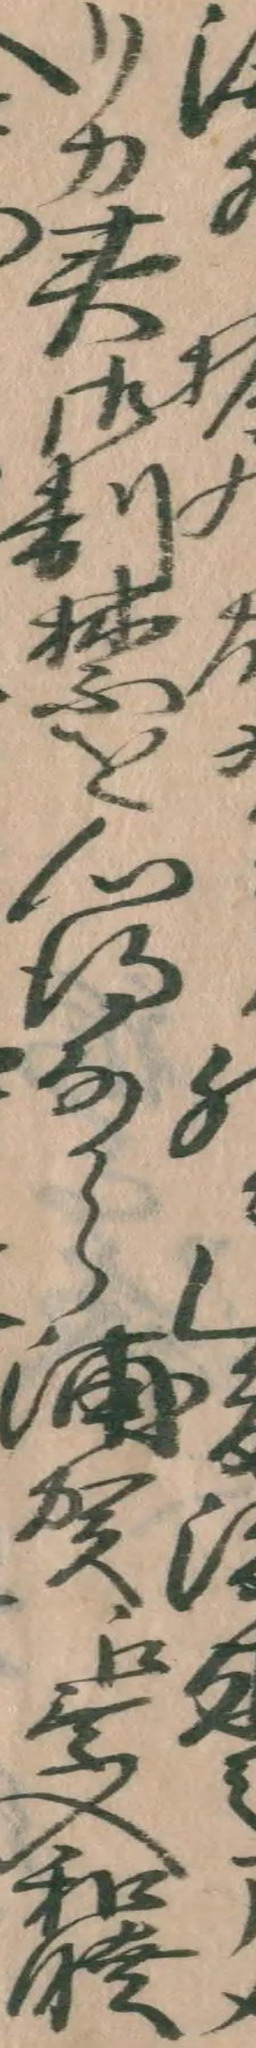リカ夷御制禁を心得なから浦賀江乗入和睦
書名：麗斎叢書. 20
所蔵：国立国会図書館 National Diet Library, JAPAN
